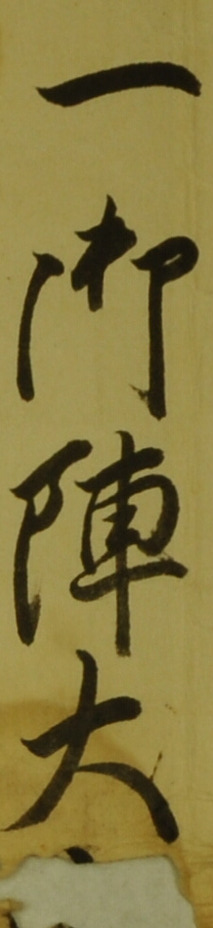一御陣太
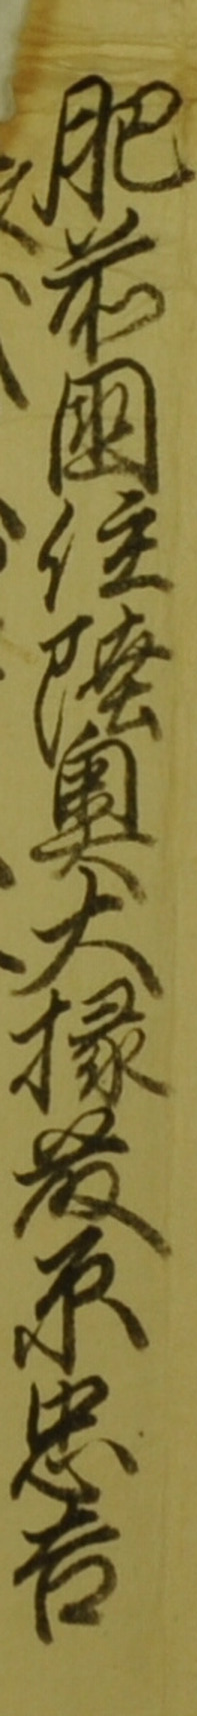御刀肥前国住陸奥大掾藤原忠吉
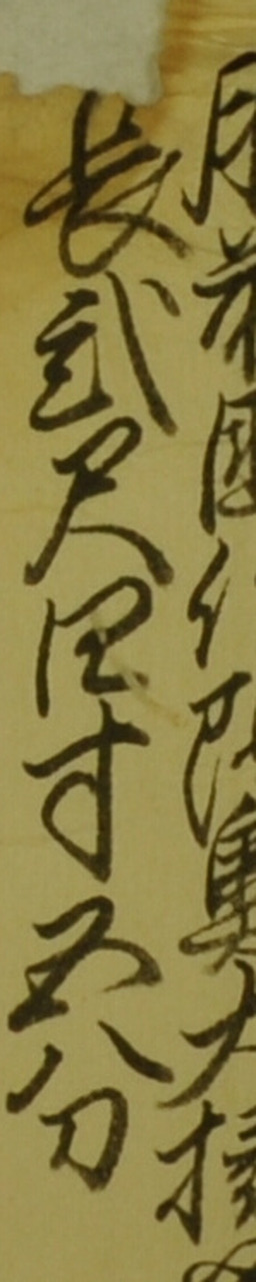長弍尺四寸半五分
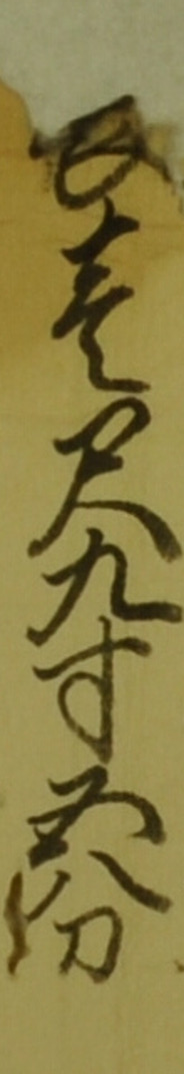長壱尺九寸五分
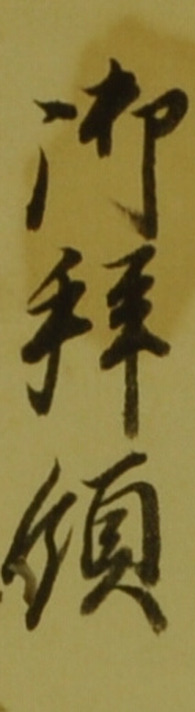御拝領
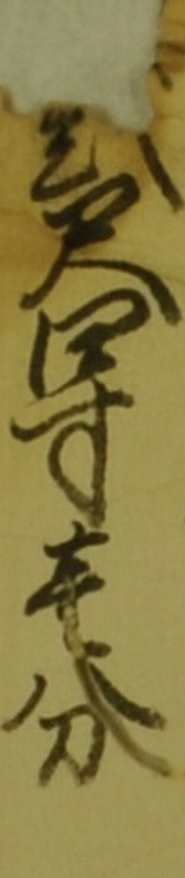弍尺四寸壱分
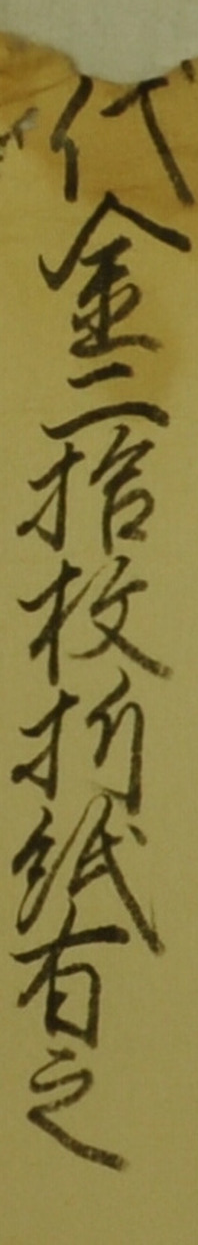代金ニ拾枚折紙有之
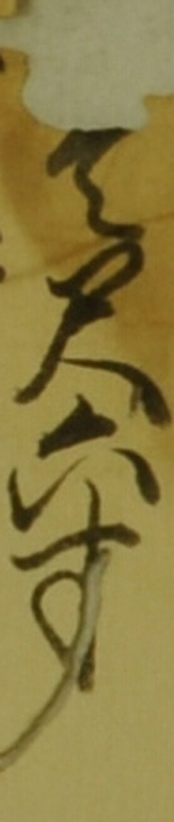壱尺六寸
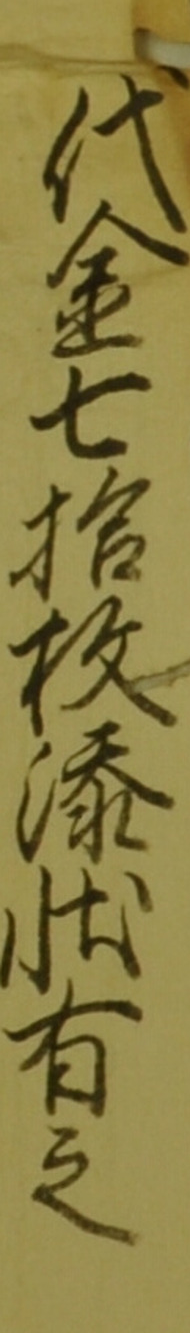代金七拾枚添状有之
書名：覚
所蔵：伊那市立高遠町図書館・合同会社AMANE
